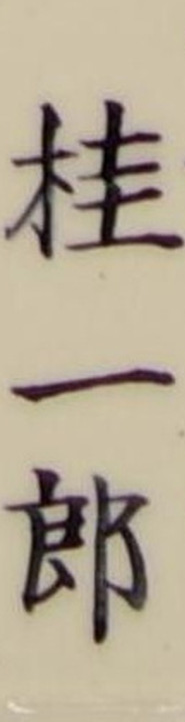桂一郎
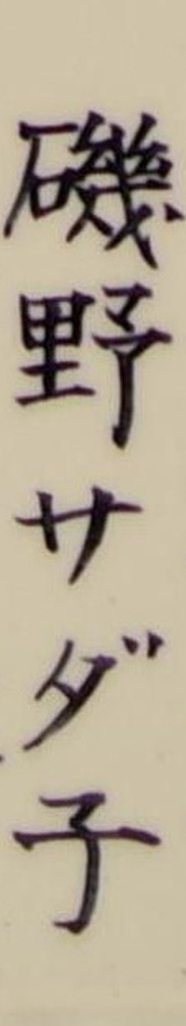磯野サダ子
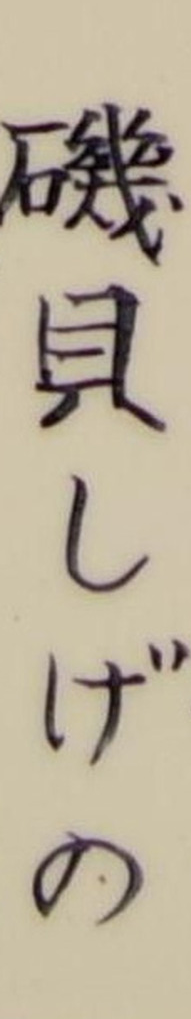磯貝しげの
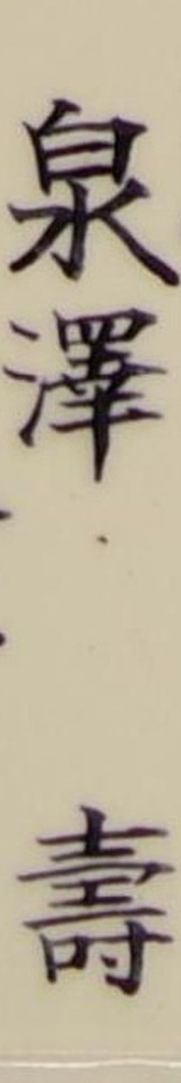泉澤壽
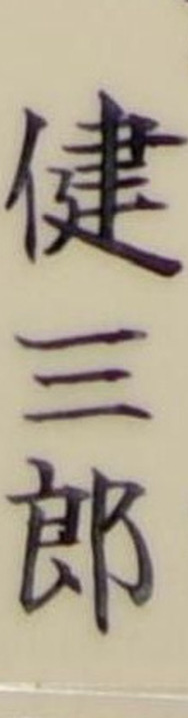健三郎
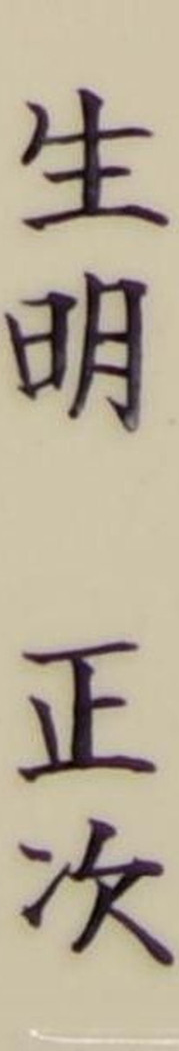生明正次
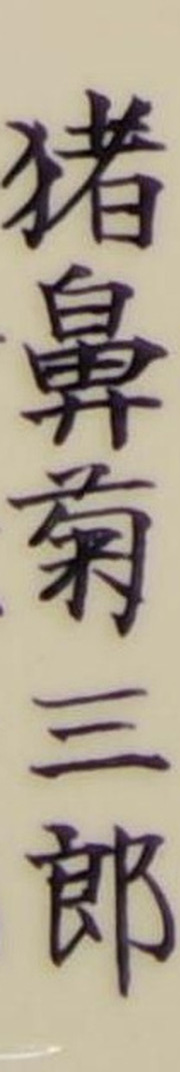猪鼻菊三郎
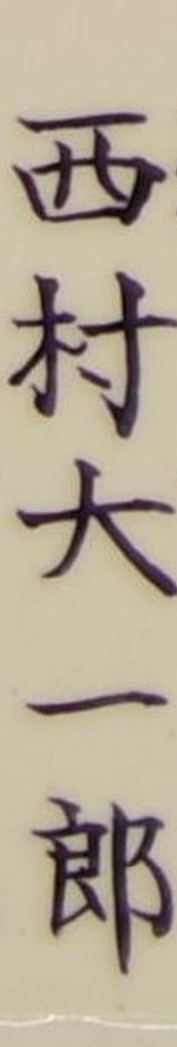西村大一郎
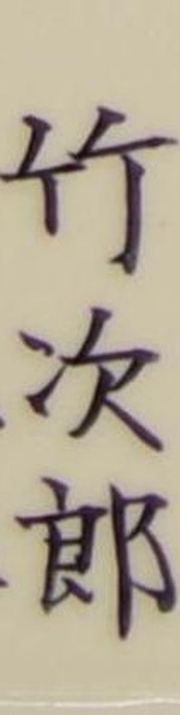竹次郎

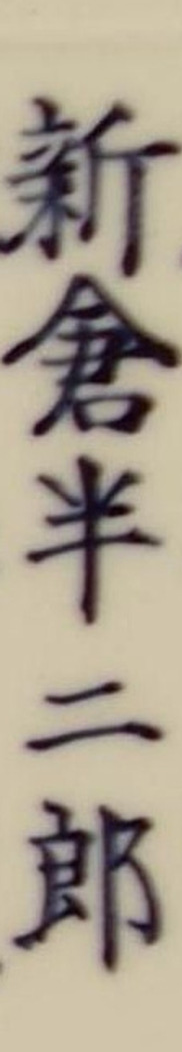新倉半二郎
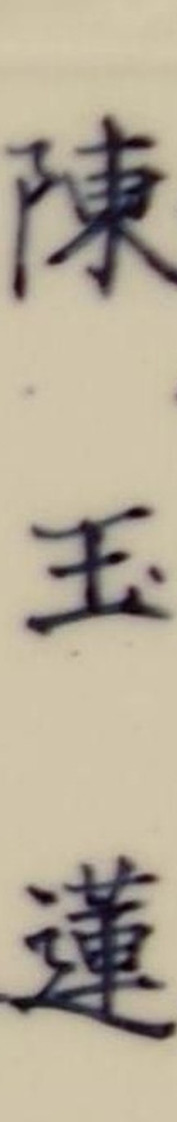陳玉蓮
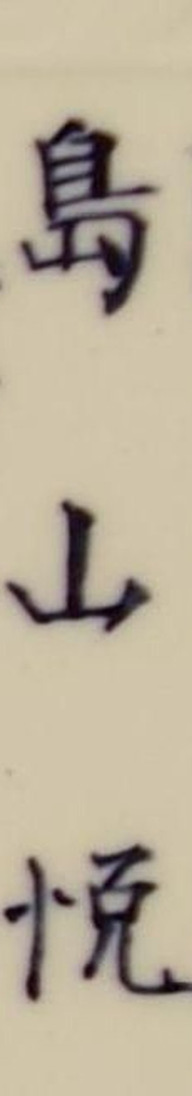島山悦
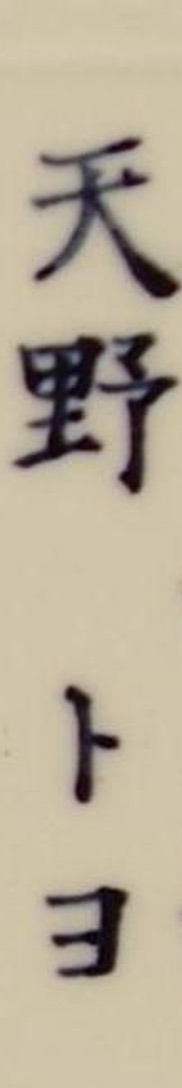天野トヨ
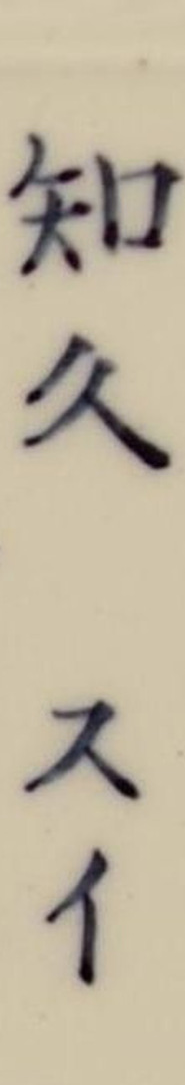知久スイ
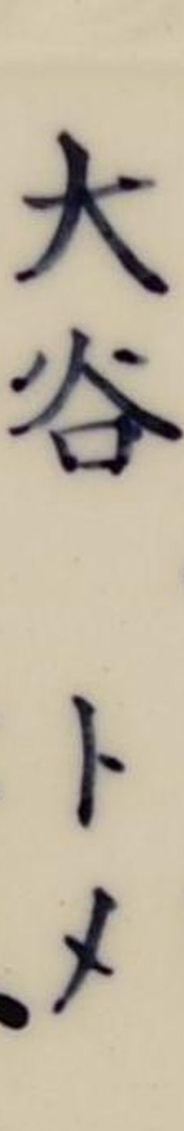大谷トメ
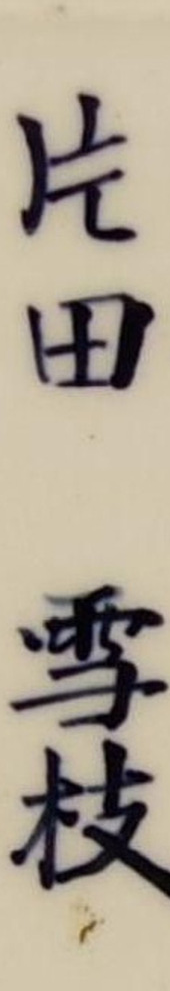片田雪枝
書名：E~L
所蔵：高野山金剛峯寺
